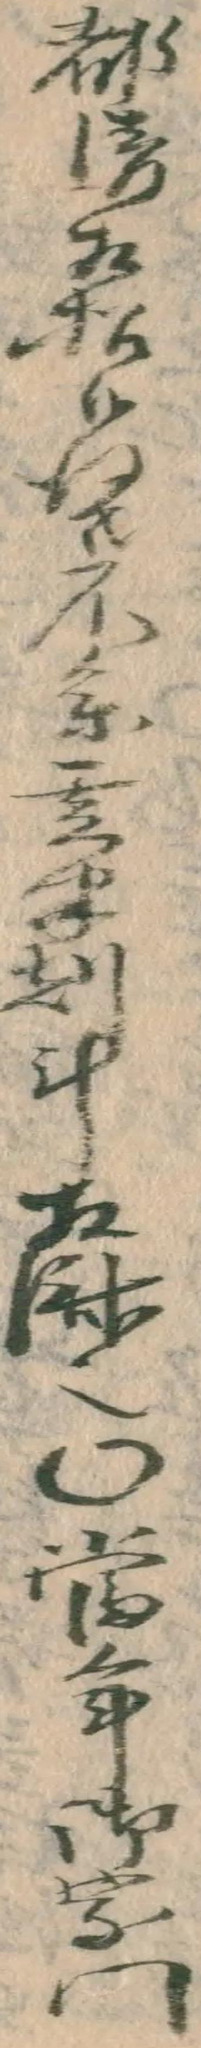都清相招候得共不参亥半刻斗相済也○當年御家門
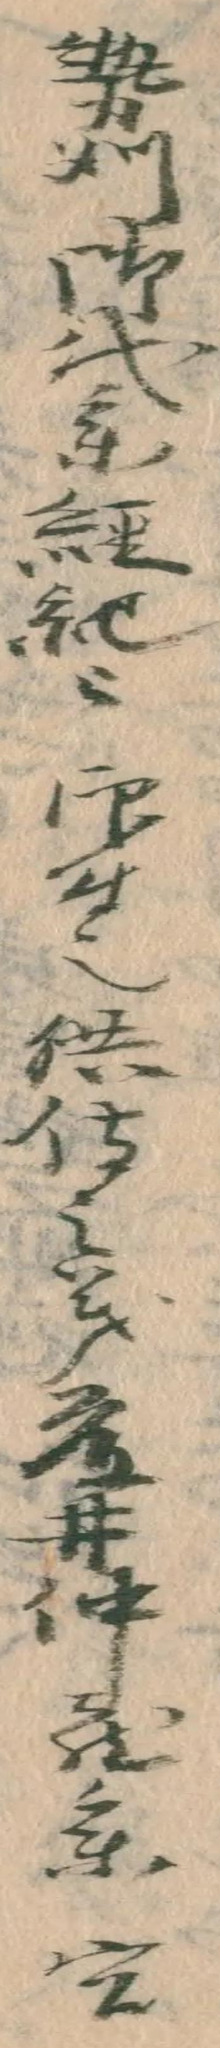勢州御代参経紀被仰付也供侍之義藤井仲蔵参宮
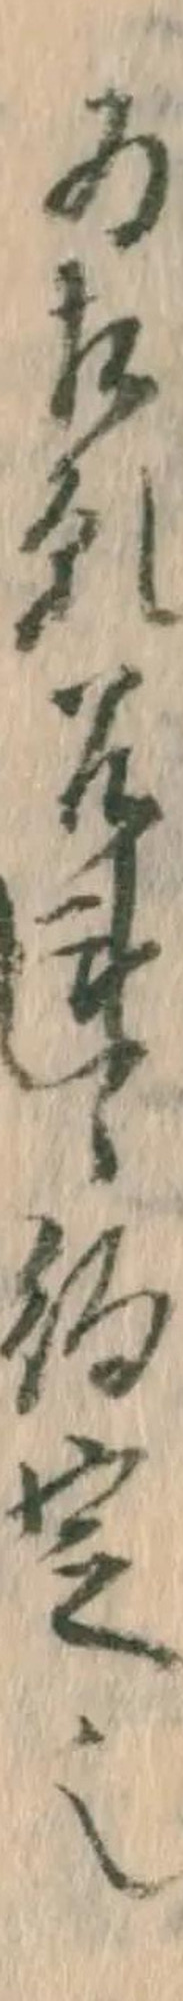為相願召連候約定也
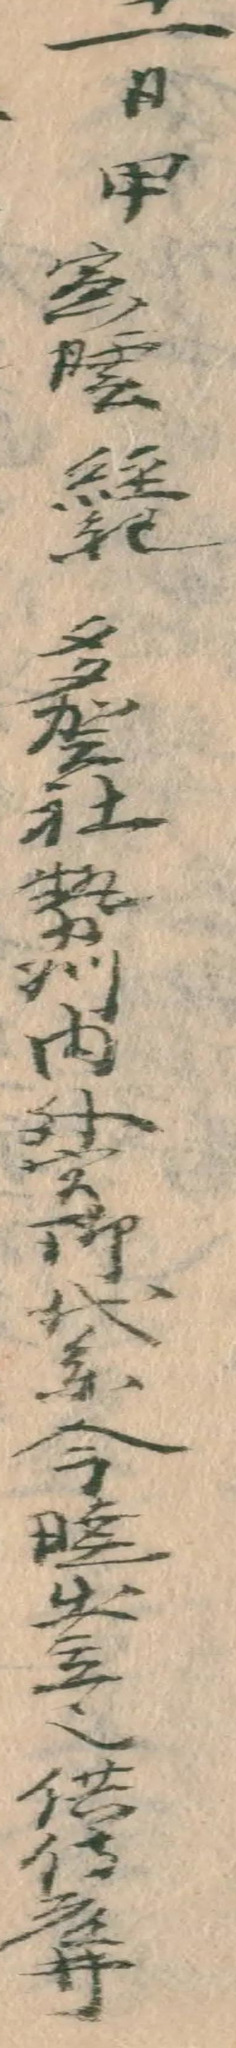十一日甲寅曇経紀多賀社勢州内外宮御代参今暁出立也供侍藤井
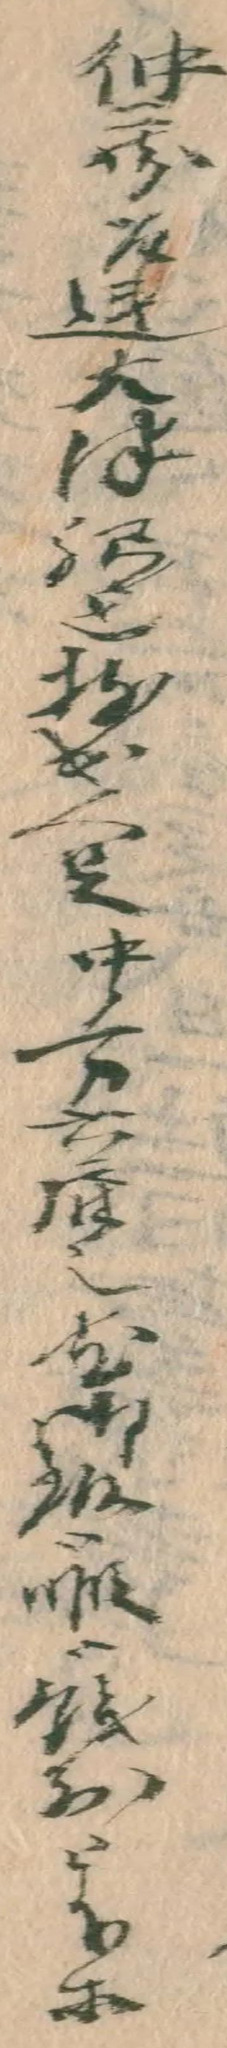仲蔵召連大津沼迄持出人足中ノ万六雇也尤御殿御隙御銭到被下等
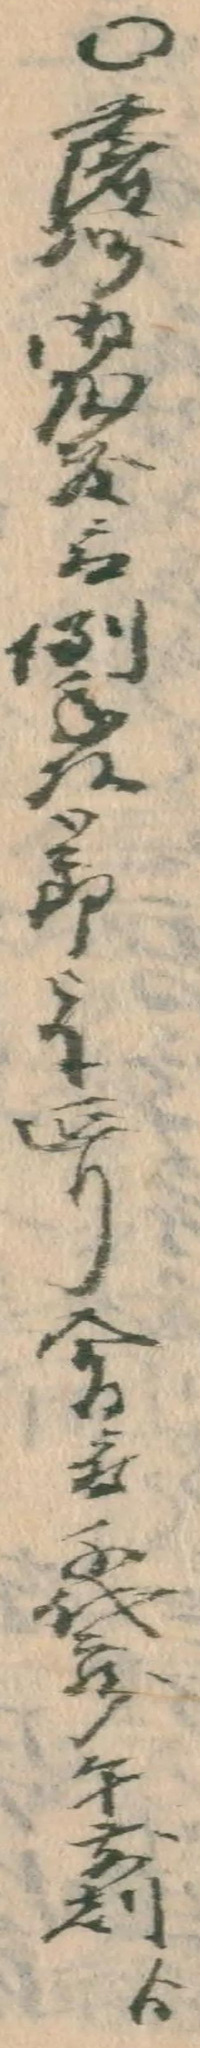○薩州御屋敷ニ而例年頭御節已下延引今日ニ付千代蔵午前刻ゟ
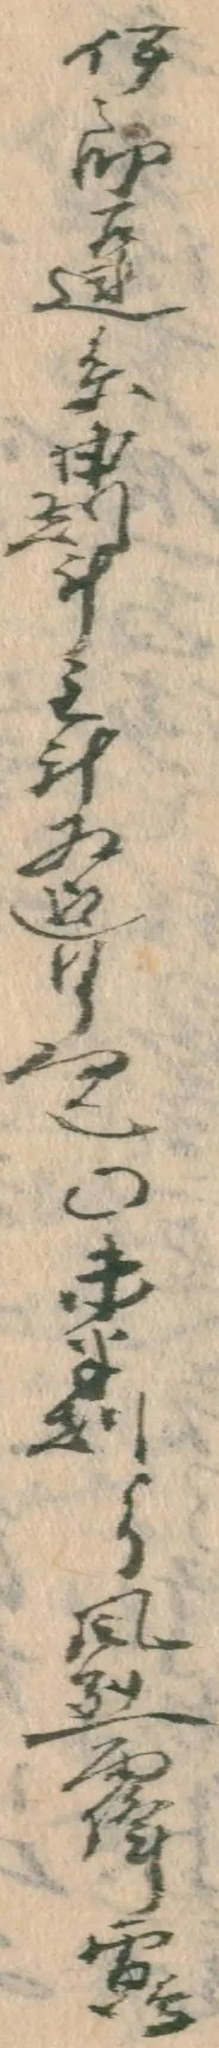伊之助召連参申刻斗主計為廻透引向也〇未半刻より風烈雨降り雷鳴
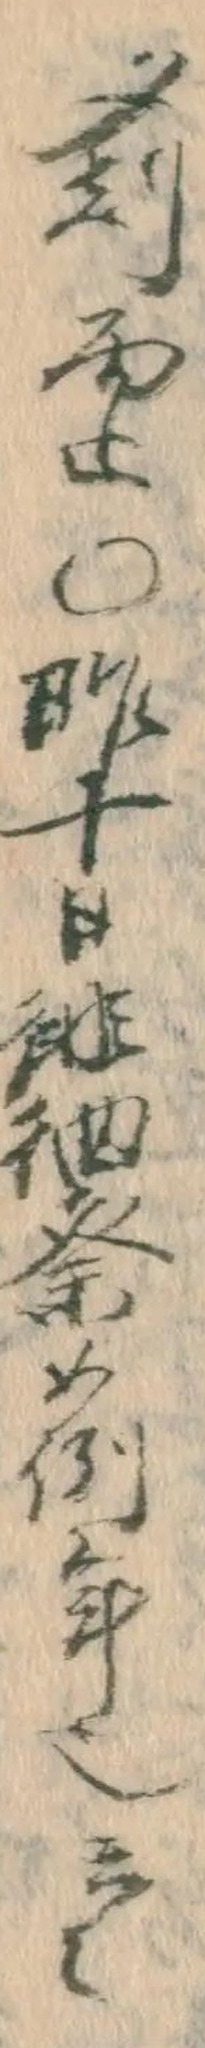夕刻雨止〇昨十日徘徊祭如例年也云々
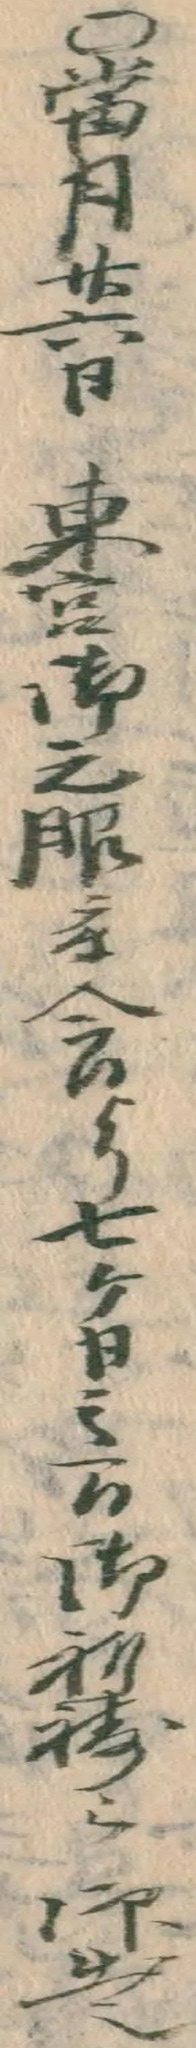○當月廿六日東宮御元服ニ付今日より七ヶ日之間御祈祷被仰出也
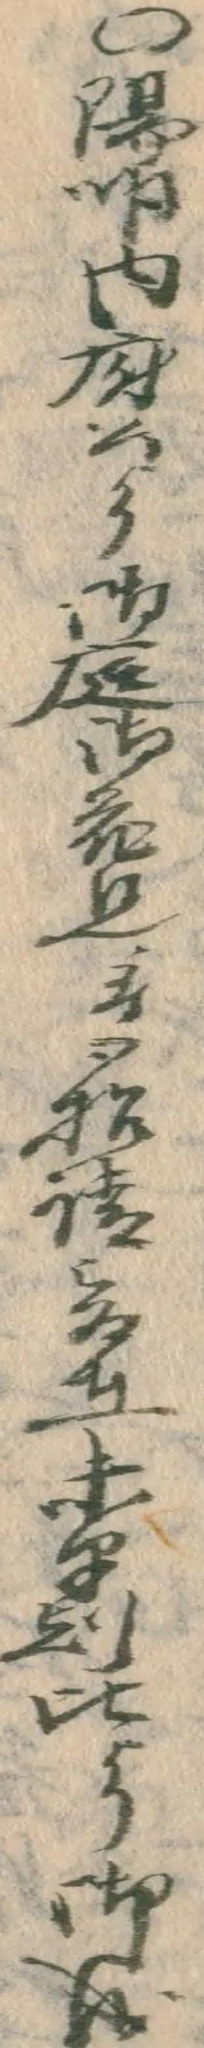○陽明内府公より御庭御花見ニ付御招請被有在未半刻比より御成
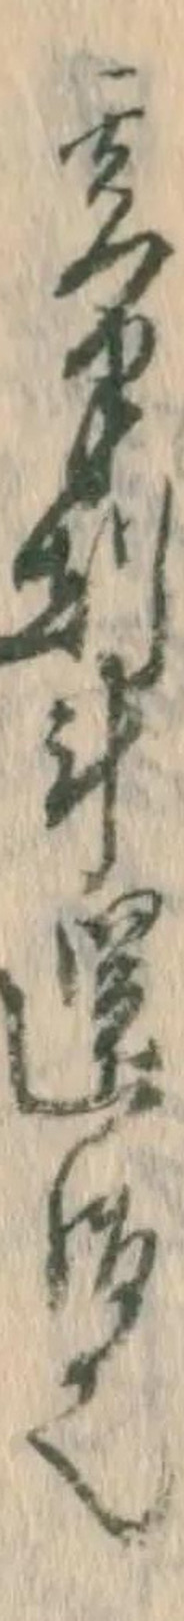亥半刻斗還御也
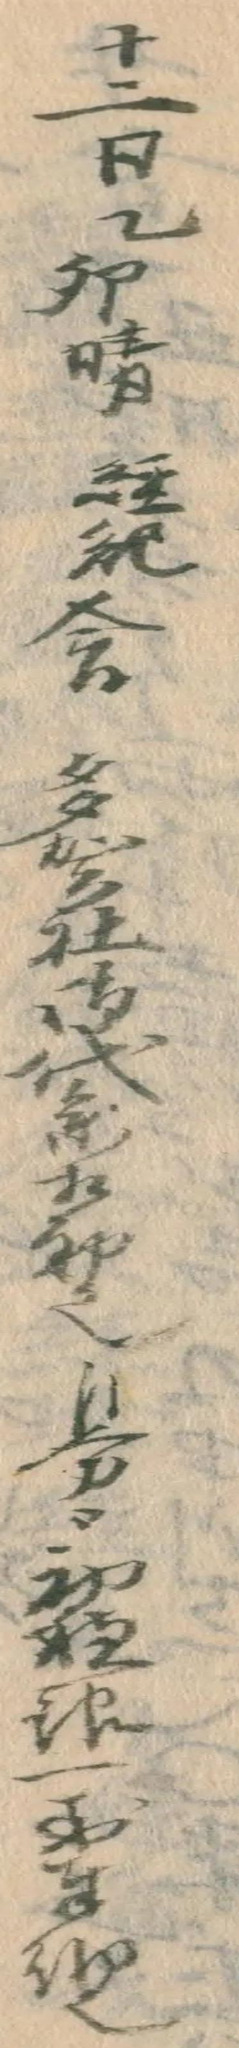十二日乙卯晴経紀今日多賀社御代参相勤也自分御初穂銀一朱奉納也
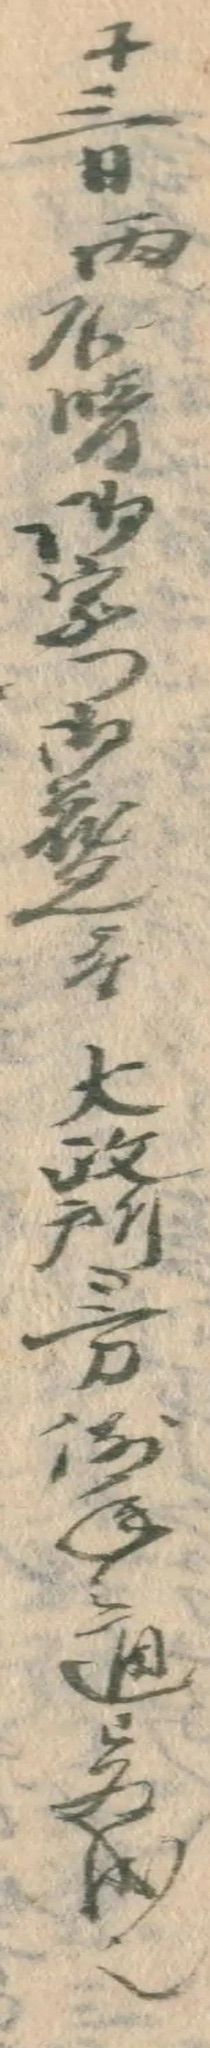十三日丙辰晴御家門御花見ニ付大政所御方例年之通被為成也
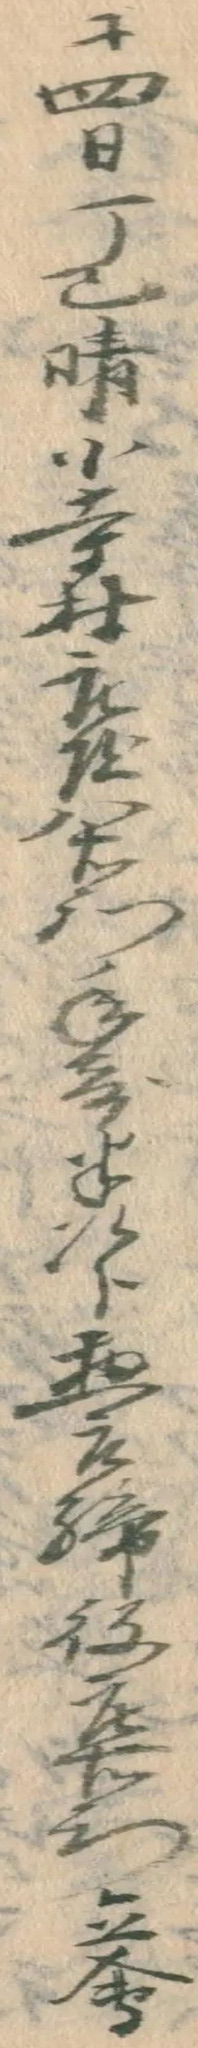十四日丁巳晴小寺村庄屋八右衛門年寄半次郎惣取締役庄右衛門立會
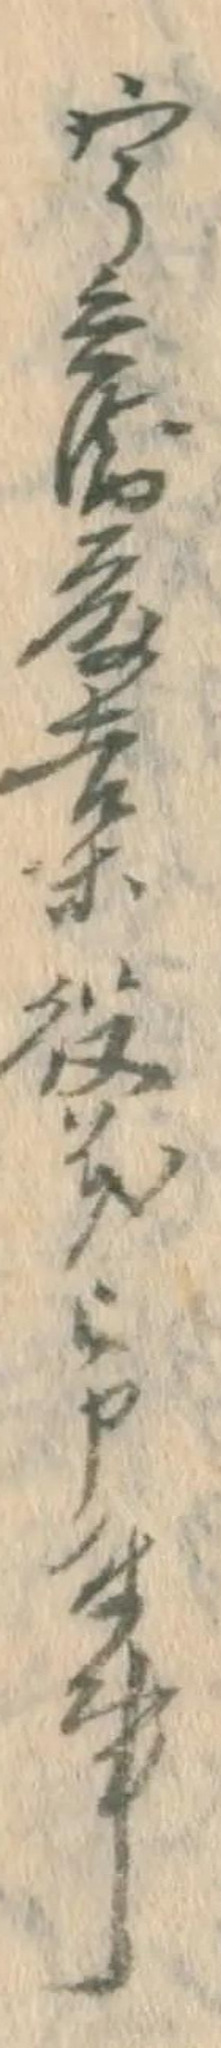宇兵衛藤吉等役義被申付事
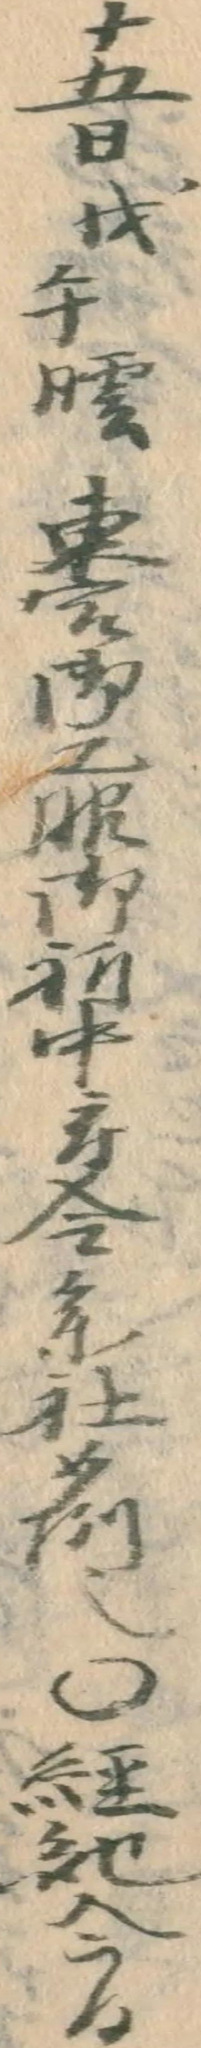十五日戌午曇東宮御元服御祈中ニ付令参社如例也○経紀今日
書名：賀茂社記録. 第69冊
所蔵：国立国会図書館 National Diet Library, JAPAN
